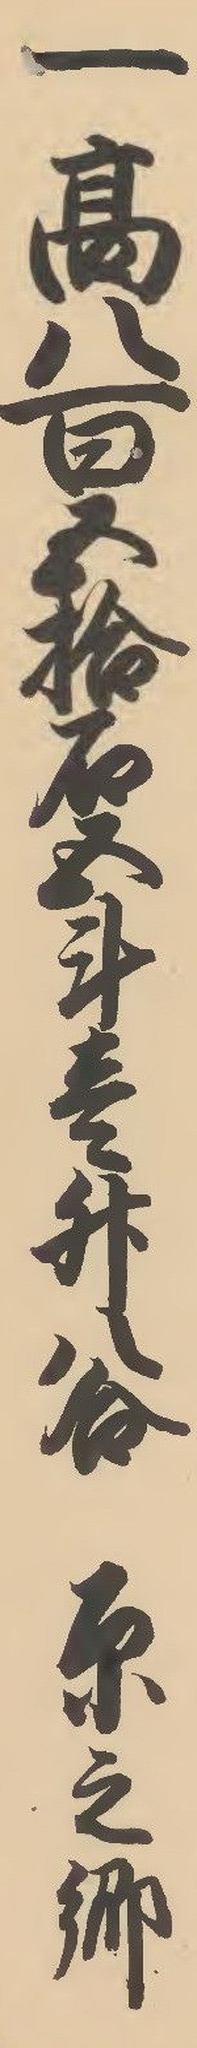一髙八百五拾石五斗壱升八合原之郷

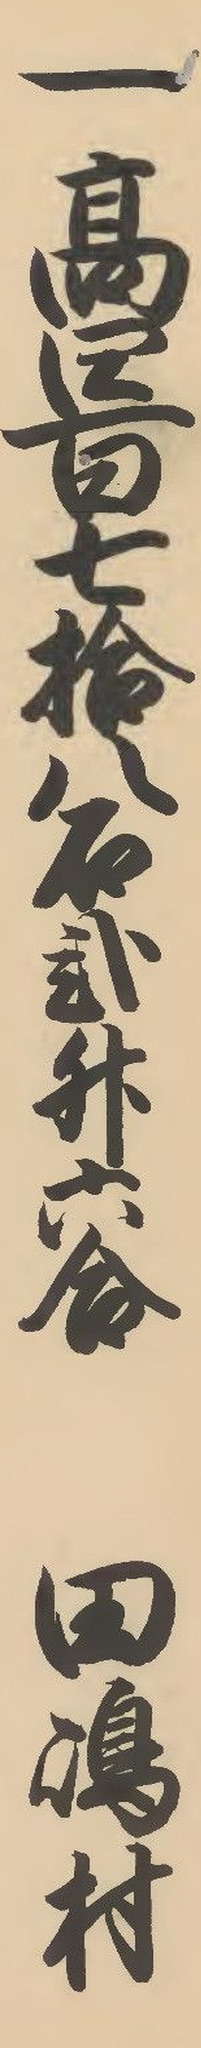一髙四百七拾八石弐升六合田嶋村
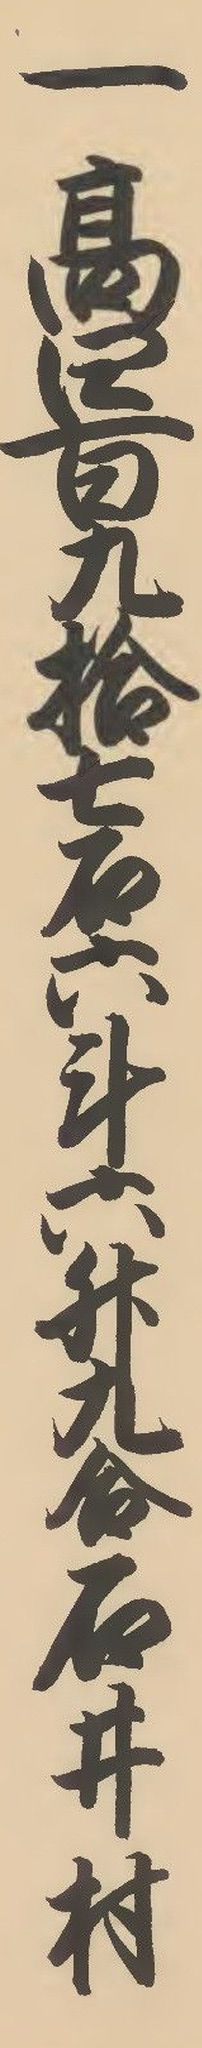一髙四百九拾七石六斗六升九合石井村
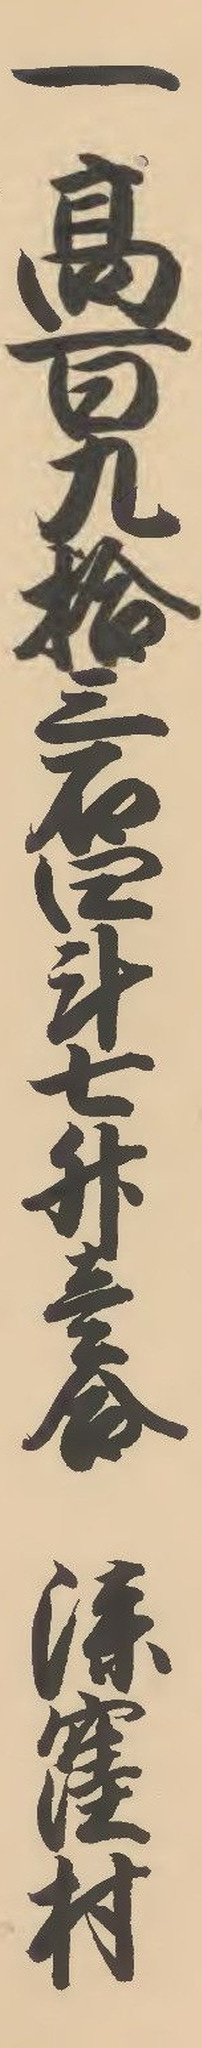一髙百九拾三石四斗七升三合漆窪村
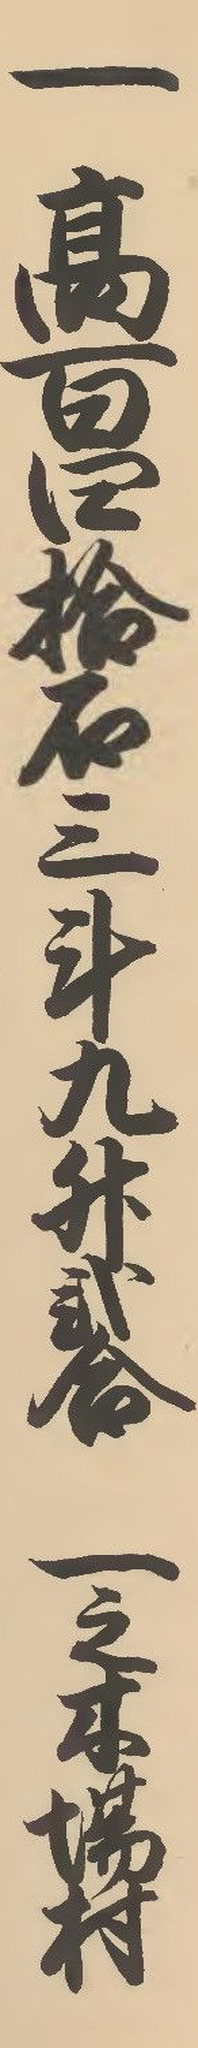一髙百四拾石三斗九升弐合一之木場村
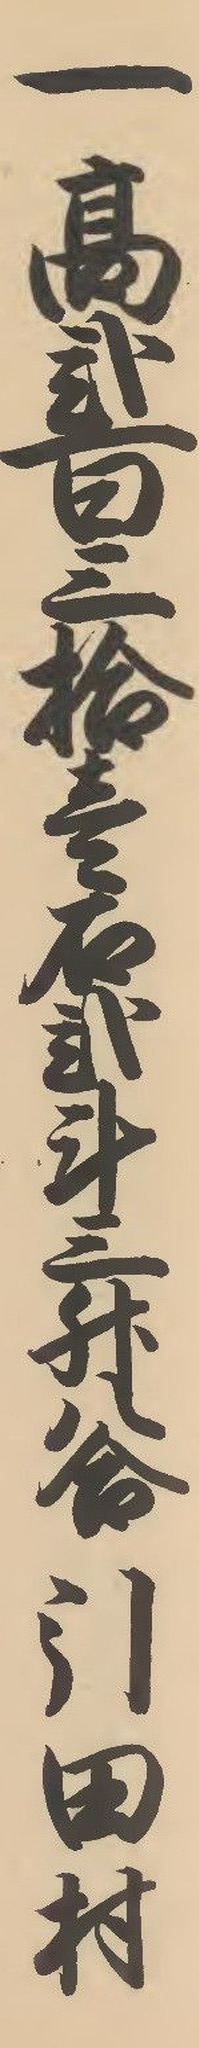一髙弐百三拾壱石弐斗三升八合引田村
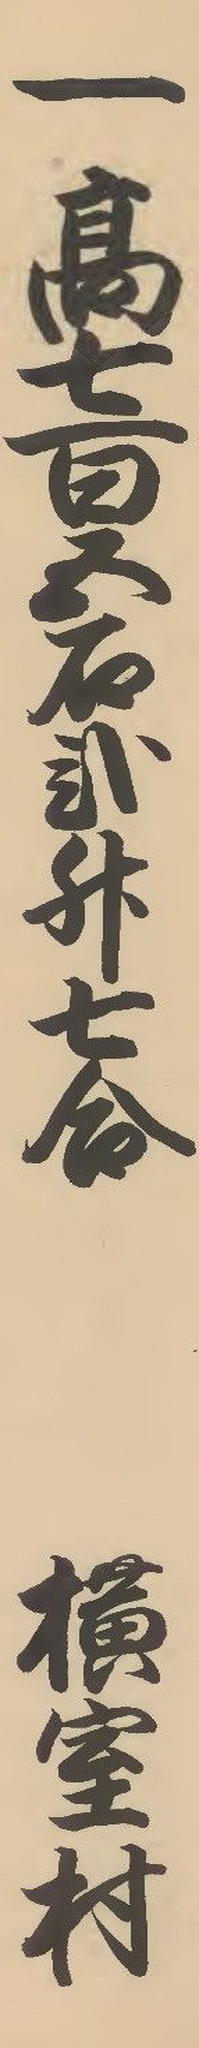一髙七百五石弐升七合横室村
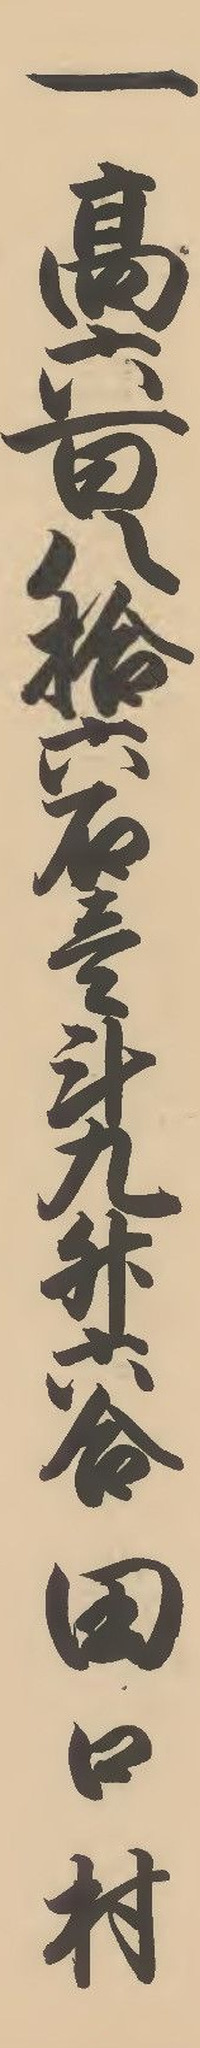一髙六百八拾六石壱斗九升六合田口村
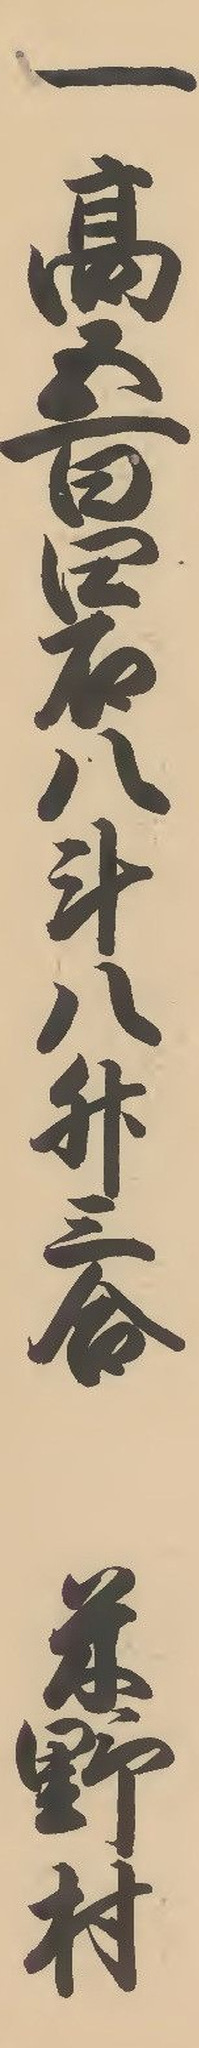一髙五百四石八斗八升三合米野村

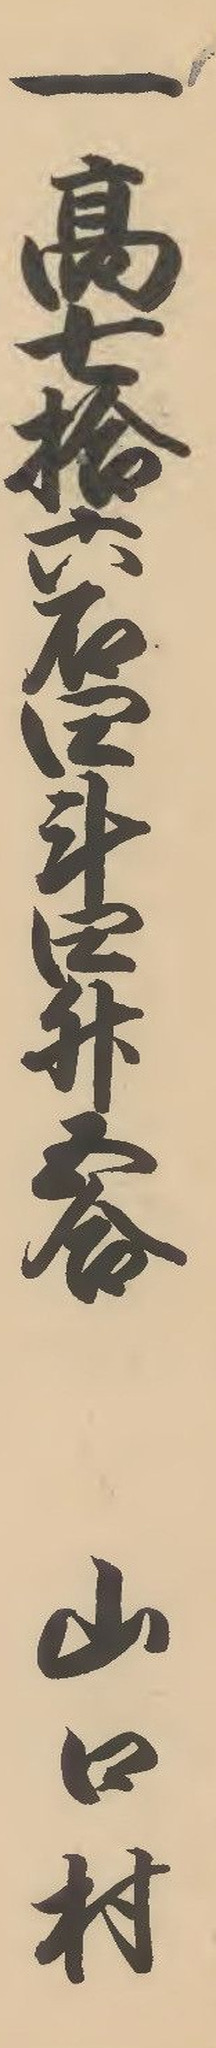一髙七拾六石四斗四升五合山口村
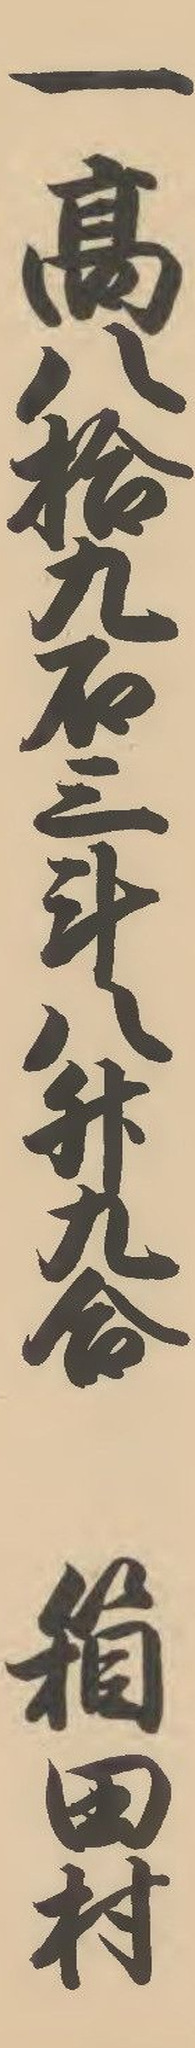一髙八拾九石三斗八升九合箱田村
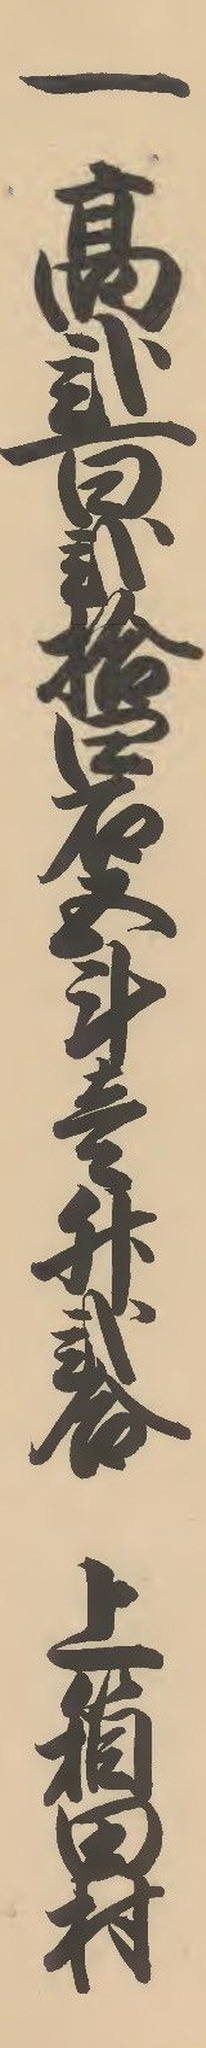一髙弐百弐拾四石五斗壱升弐合上箱田村
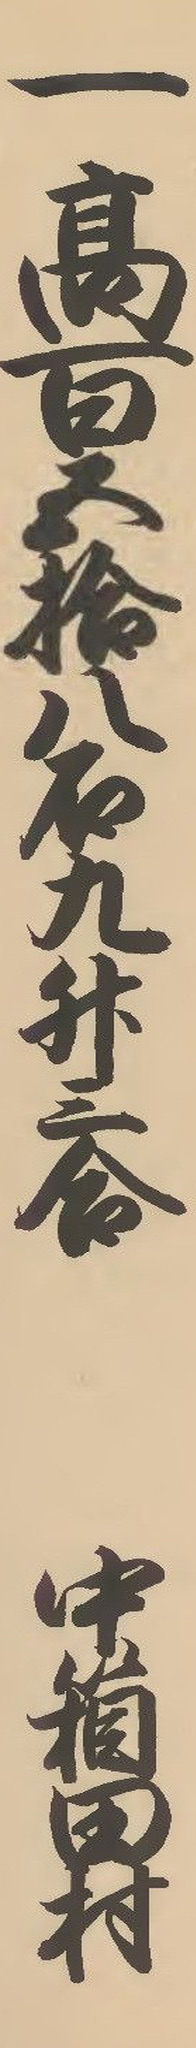一髙百五拾八石九斗三合中箱田村
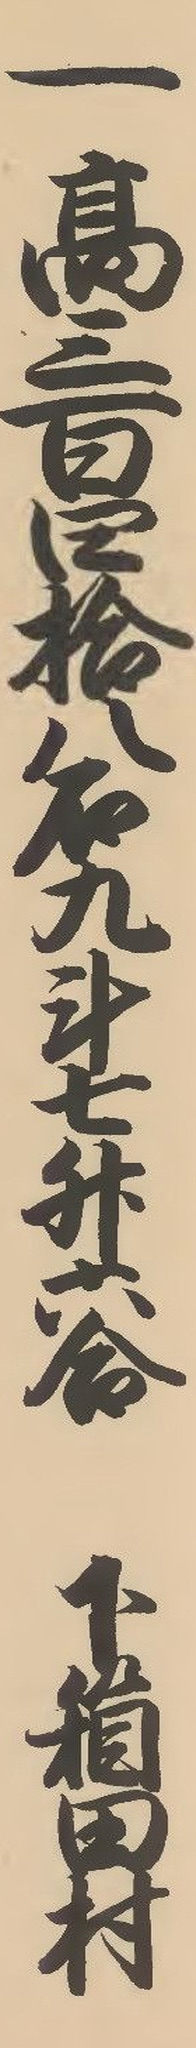一髙三百四拾八石九斗七升六合下箱田村
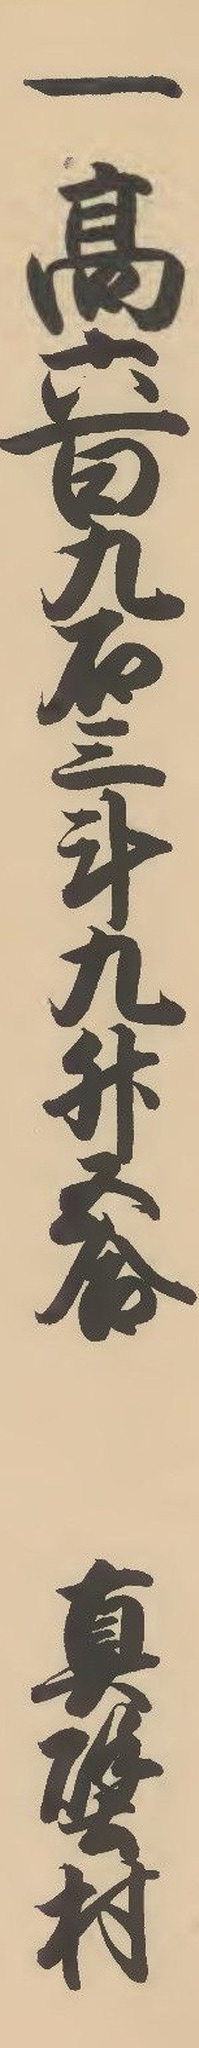一髙六百九石三斗九升五合真壁村
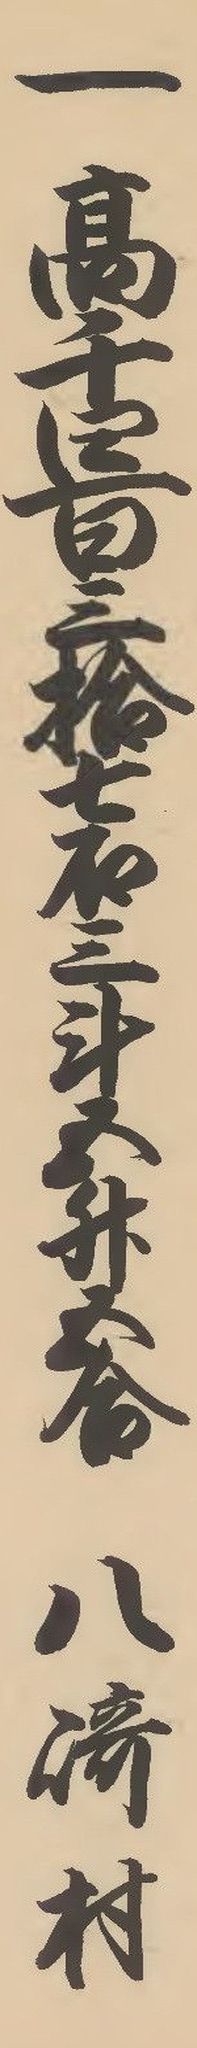一髙千四百三拾七石三斗五升五合八崎村
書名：上野国郷帳
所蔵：国立公文書館 National Archives of Japan
